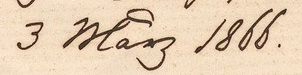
3 März 1866.
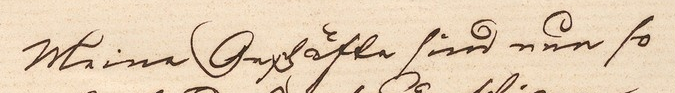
Meine Geschäfte sind nun so
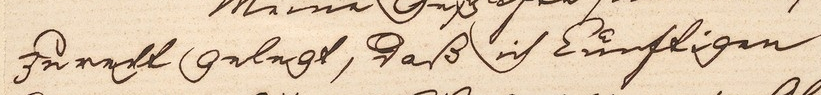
zurecht gelegt, daß ich künftigen
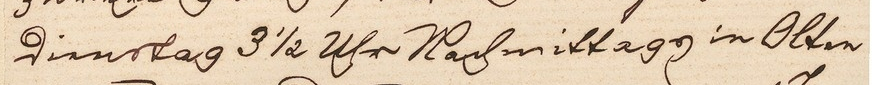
Dienstag 3 ½ Uhr Nachmittags in Olten
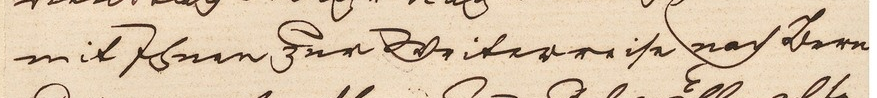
mit Ihnen zur Weiterreise nach Bern
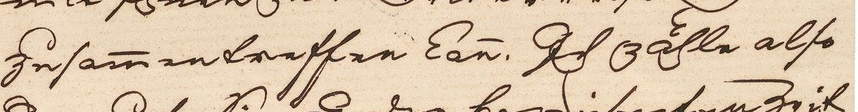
zusammentreffen kann. Ich zähle also
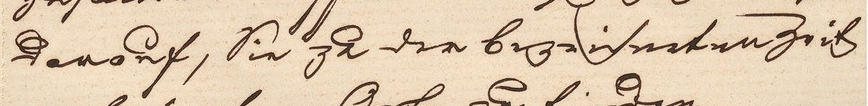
darauf, Sie zu der bezeichneten Zeit
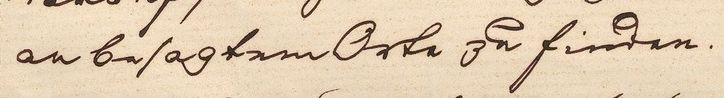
an besagtem Orte zu finden.
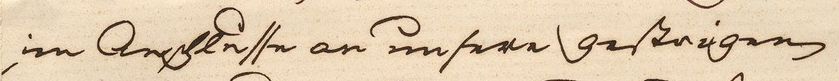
im Anschlusse an unsere gestrigen
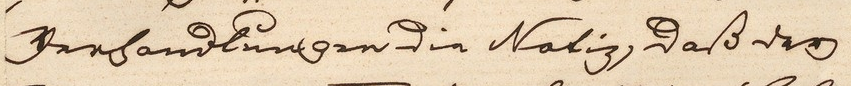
Verhandlungen die Notiz, daß der
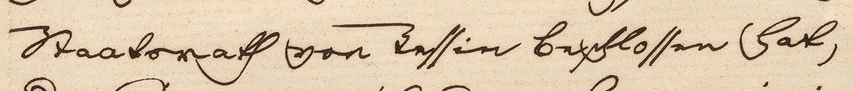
Staatsrath von Tessin beschlossen hat,
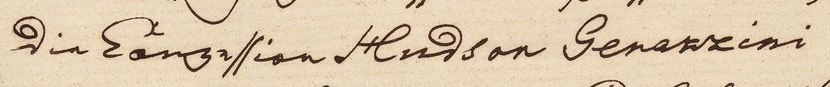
die Conzession Hudson Genazzini
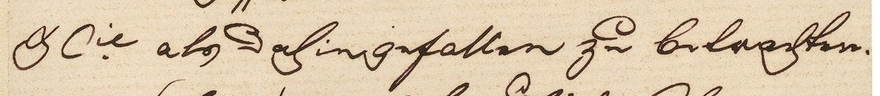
& Cie als dahingefallen zu betrachten.
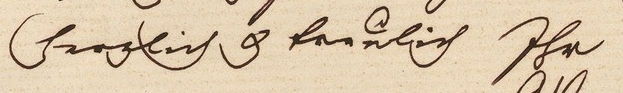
Herzlich & treulich Ihr
